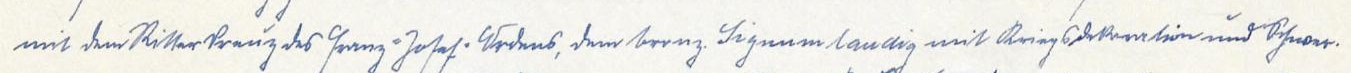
mit dem Ritterkreuz des Franz-Josef-Ordens, dem bronz. Signum Laudis mit Kriegsdekoration und Schwer
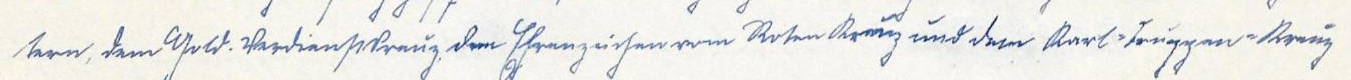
tern, mit dem goldenen Verdienstkreuz, dem Ehrenzeichen vom Roten Kreuz und dem Karl-Truppen-Kreuz
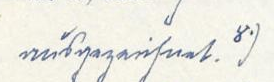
ausgezeichnet. 8)
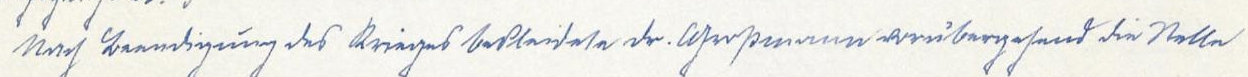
Nach Beendigung des Krieges bekleidete Dr. Großmann vorübergehend die Stelle
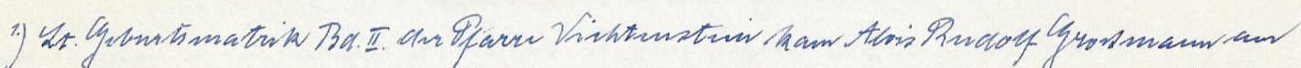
1) Laut Geburtsmatrik Bd. II. der Pfarre Vichtensteins kam Alois Rudolf Großmann
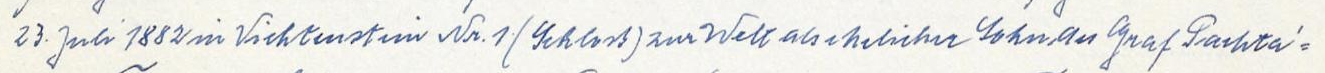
am 23. Juli 1882 in Vichtenstein Nr. 1 (Schloß) zur Welt als ehelicher Sohn des Graf Pachta‘
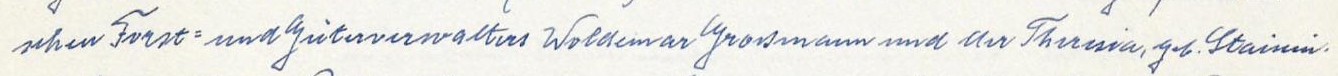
schen Forst- und Güterverwalters Waldemar Großmann und der Theresia geb. Stainin-
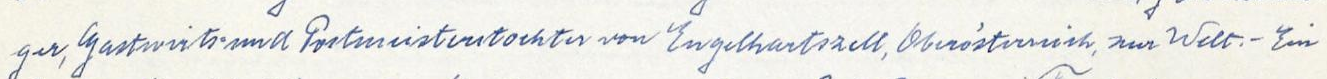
ger, Gastwirts- und Postmeistertochter von Engelhartszell, Oberösterreich, zur Welt.- Ein
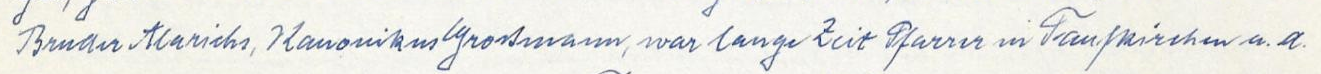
Bruder Alarichs, Kanonikus Großmann, war lange Zeit Pfarrer in Taufkirchen a. d.
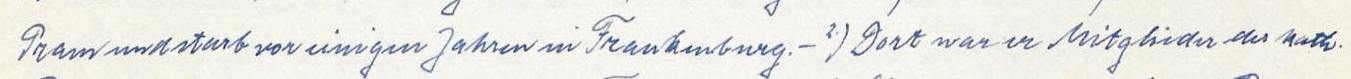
Pram und starb vor einigen Jahren in Frankenberg.- 2) Dort war er Mitglieder des kath.
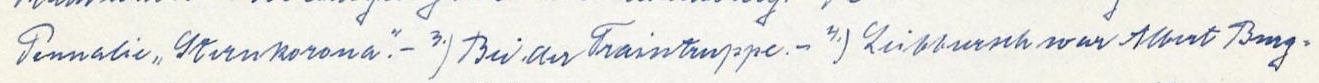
Pennalie „Sternkorona“,- 3) Bei der Traintruppe.- 4) Leibbursch war Albert Burg-
